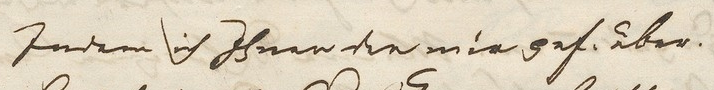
Indem ich Ihnen den mir gef. über-
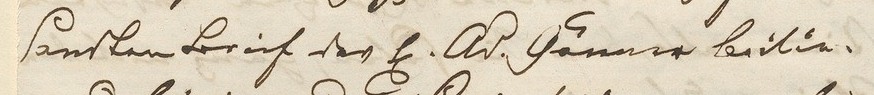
sandten Brief des H. Ad. Gönner beilie-
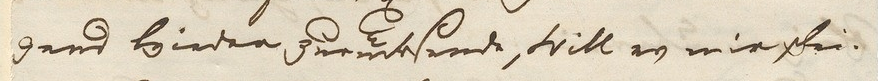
gend wieder zurücksende, will es mir schei-
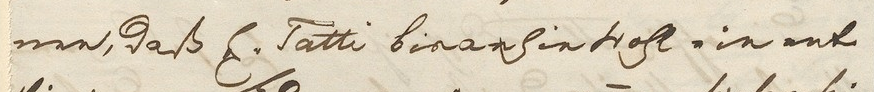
nen, daß H. Tatti bis anhin wohl ein ent-
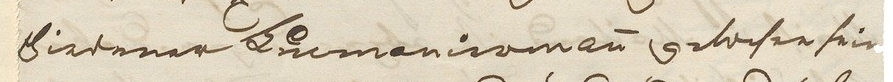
schiedener Lucmaniermann gewesen sein
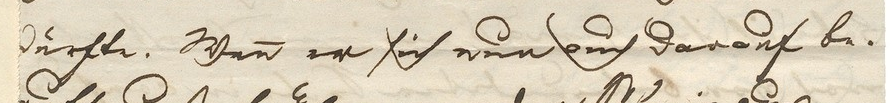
dürfte. Wenn er sich nun auch darauf be-
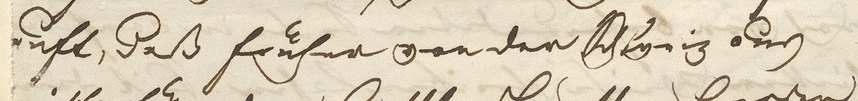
ruft, daß früher von der Schweiz aus
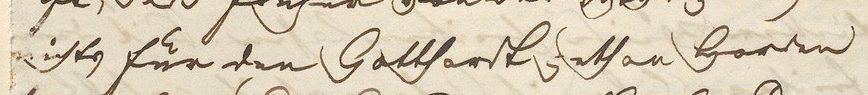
nichts für den Gotthardt gethan worden
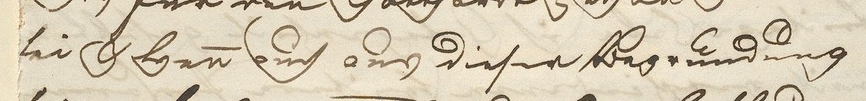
sei & wenn auch aus dieser Begründung
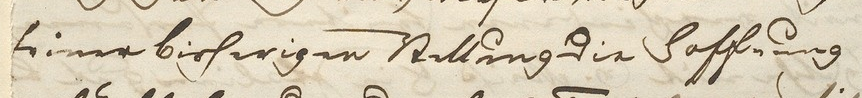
seiner bisherigen Stellung die Hoffnung
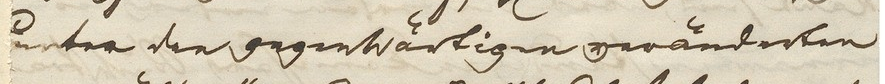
unter den gegenwärtigen veränderten
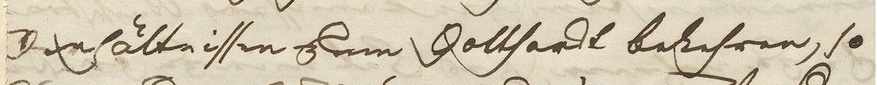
Verhältnissen zum Gotthardt bekehren, so
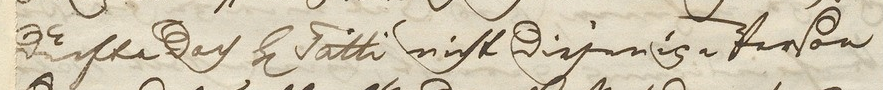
dürfte doch H. Tatti nicht diejenige Person
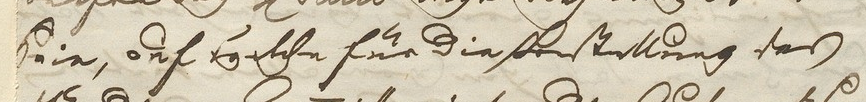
sein, auf welche für die Bestellung des
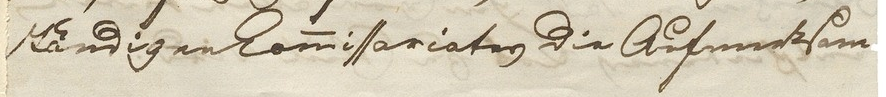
ständigen Commissariates die Aufmerksam-
